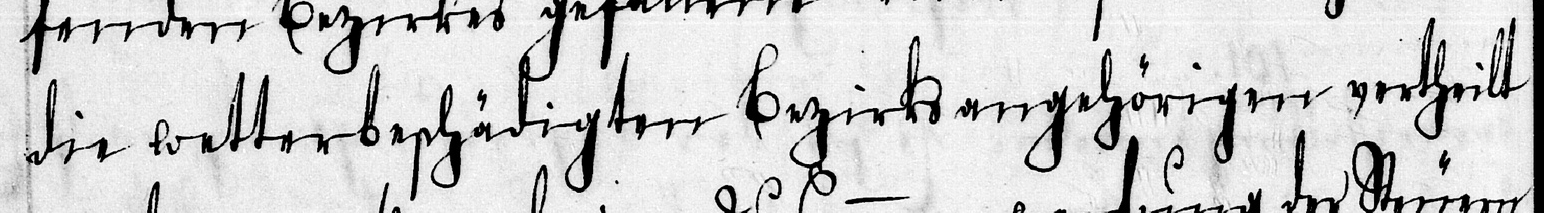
die wetterbeschädigten Bezirksangehörigen vertheilt
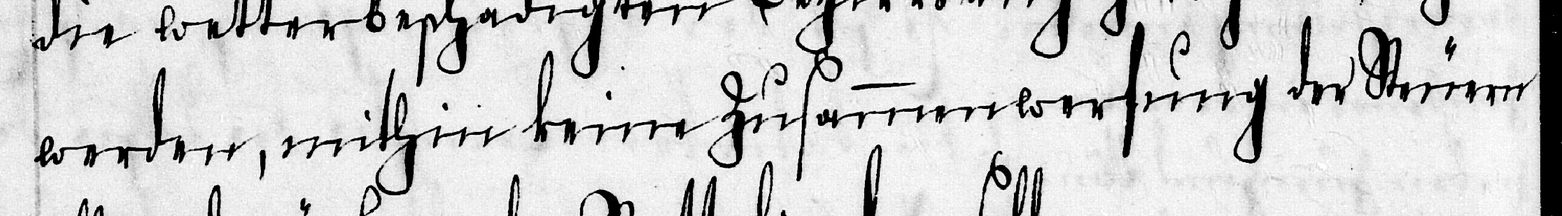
werden, mithin keine Zusammenwerfung der Steuern
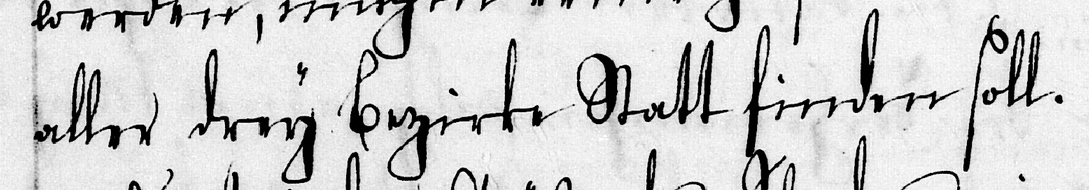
aller drey Bezirke Statt finden soll.
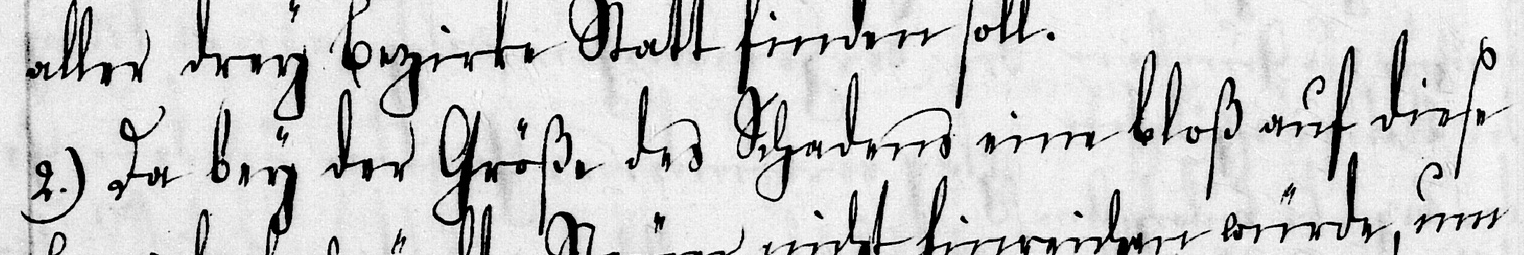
2.) Da bey der Größe des Schadens eine bloß auf diese
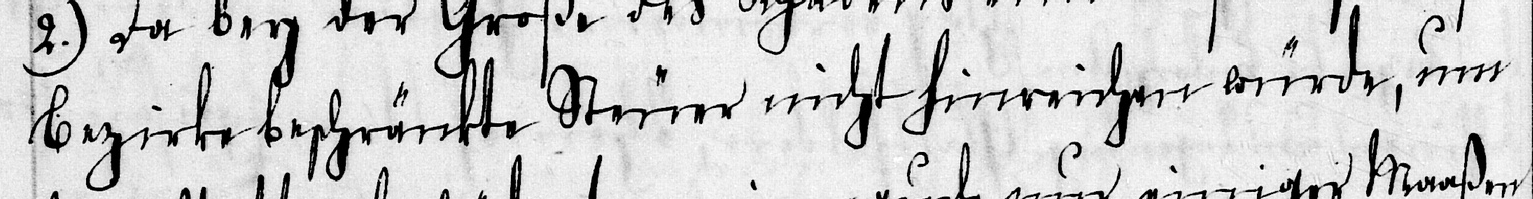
Bezirke beschränkte Steuer nicht hinreichen würde, um
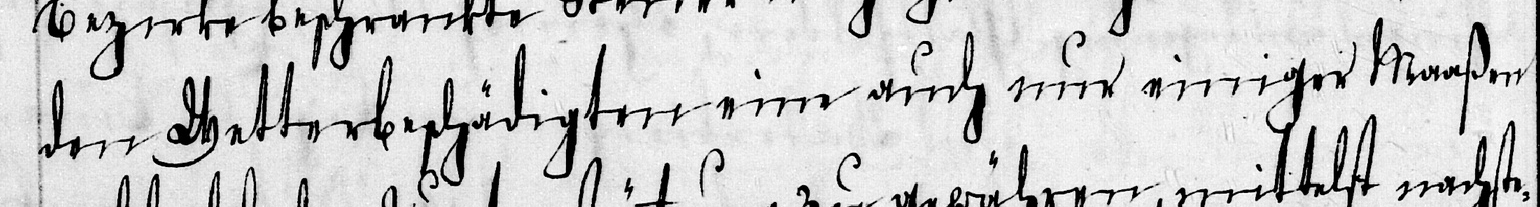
den Wetterbeschädigten eine auch nur einiger Maaßen
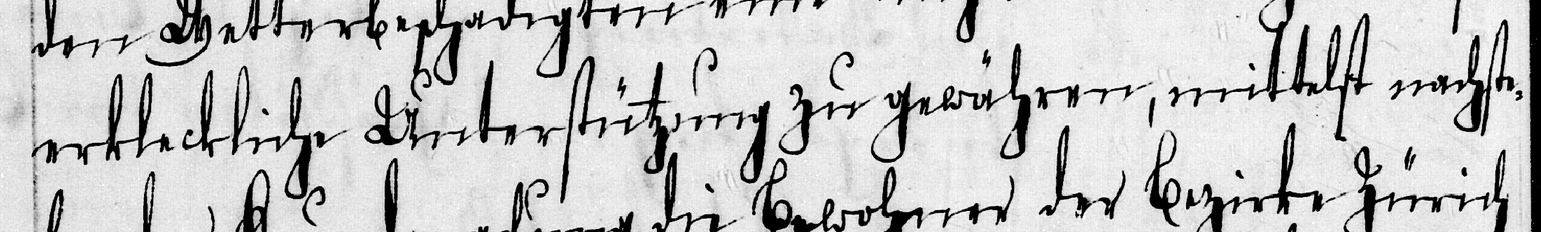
erkleckliche Unterstützung zu gewähren, mittelst nachs¬
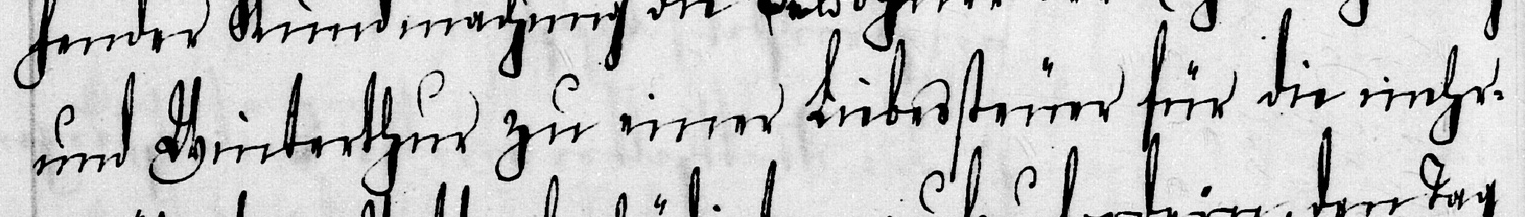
und Winterthur zu einer Liebessteuer für die mehr¬
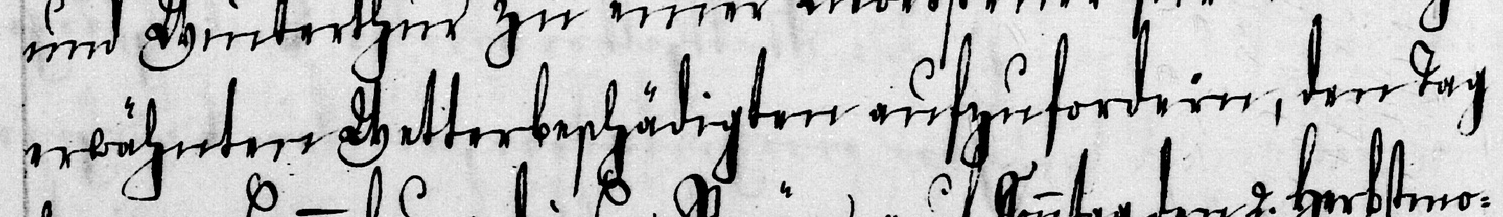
erwähnten Wetterbeschädigten aufzufordern, den Tag
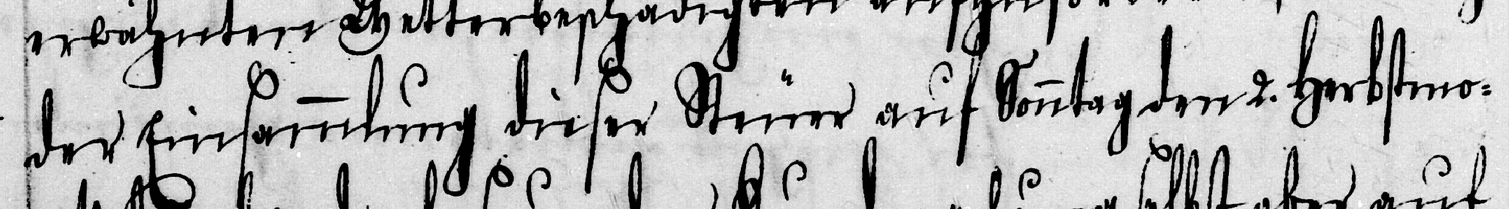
der Einsammlung dieser Steuer auf Sonntag den 2. Herbstmon¬
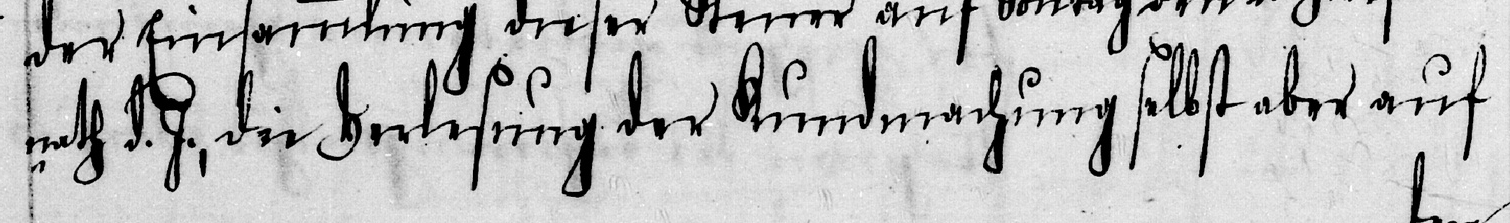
d. J., die Verlesung der Kundmachung selbst aber auf
